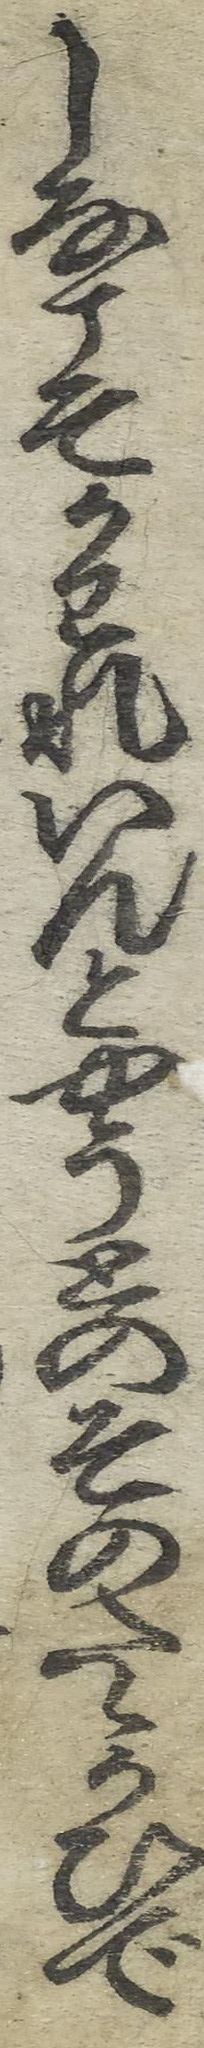しなこそかわれいんとやうとのそのたゝかひで
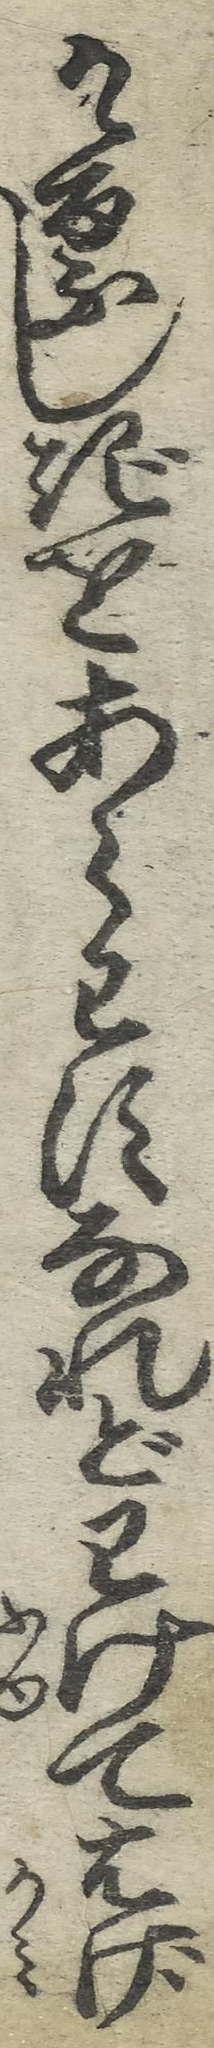かゝるふしぎをあらわすなれどわけてはげ
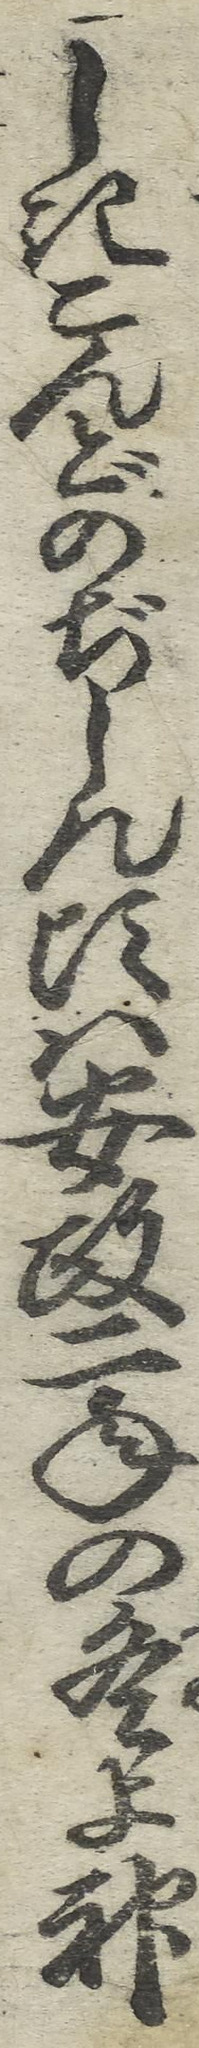しきこんどのぢしん頃は安政二年の冬よ神
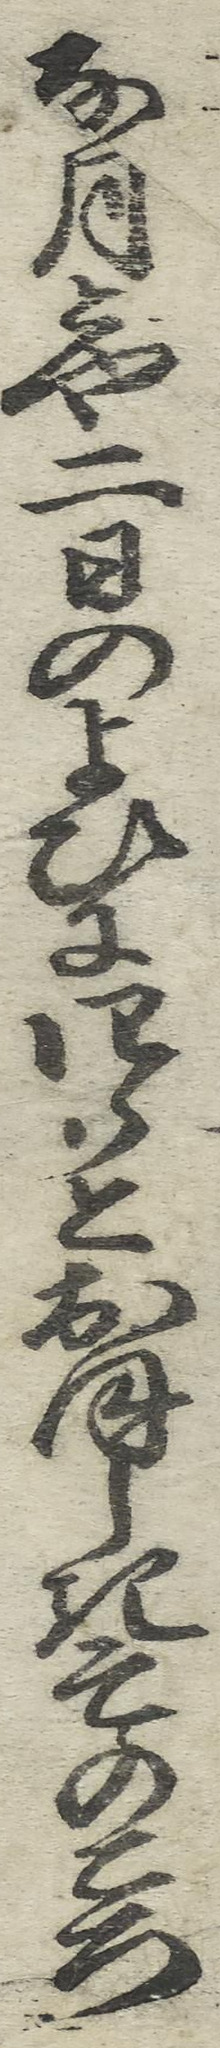な月とや二日のよひに四ツとおほしきそのころ
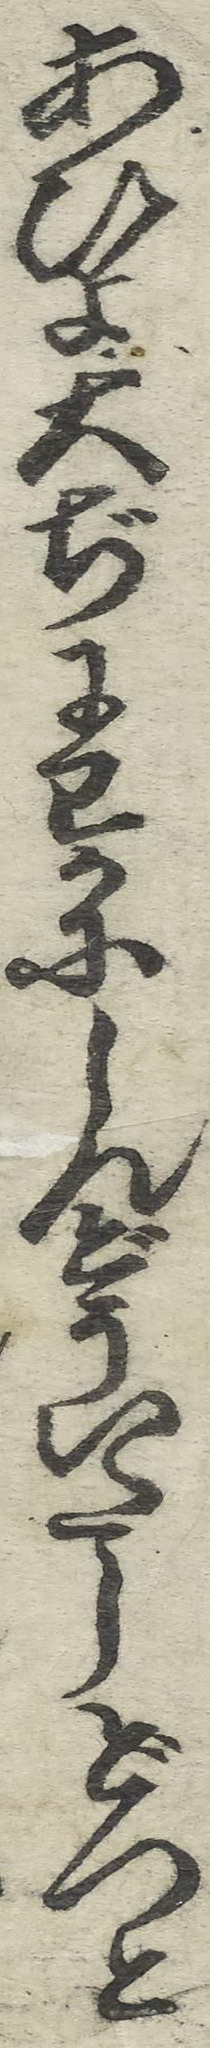あひよ大ぢにわかにしんどういたしどつと
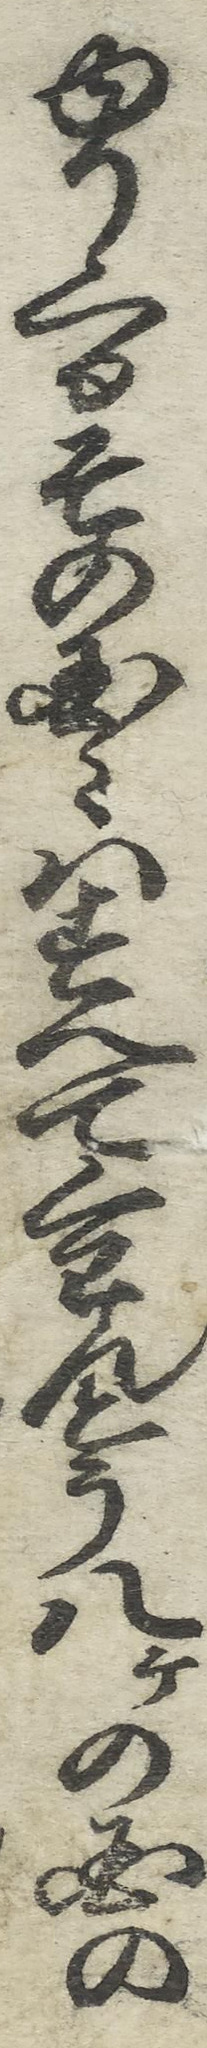ゆりくるその国〻はすへてくわんとう八ヶの国の
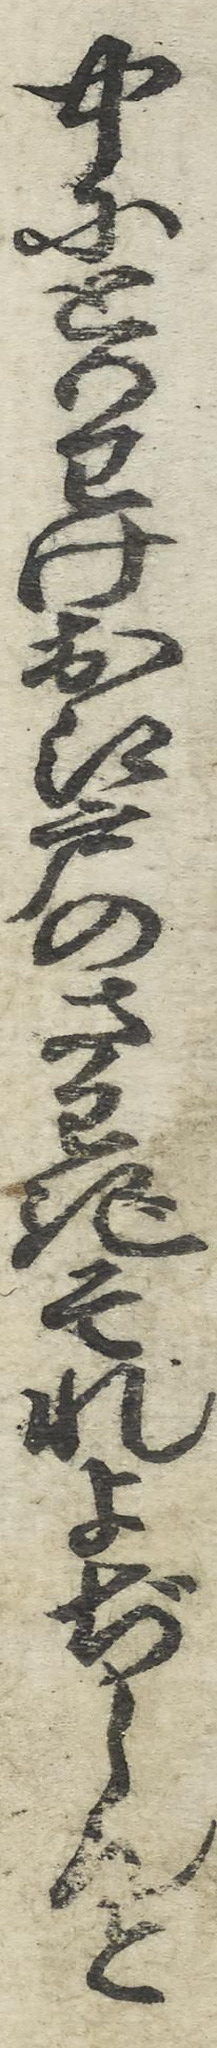中にとりわけお江戸のさわぎそれよぢしんと
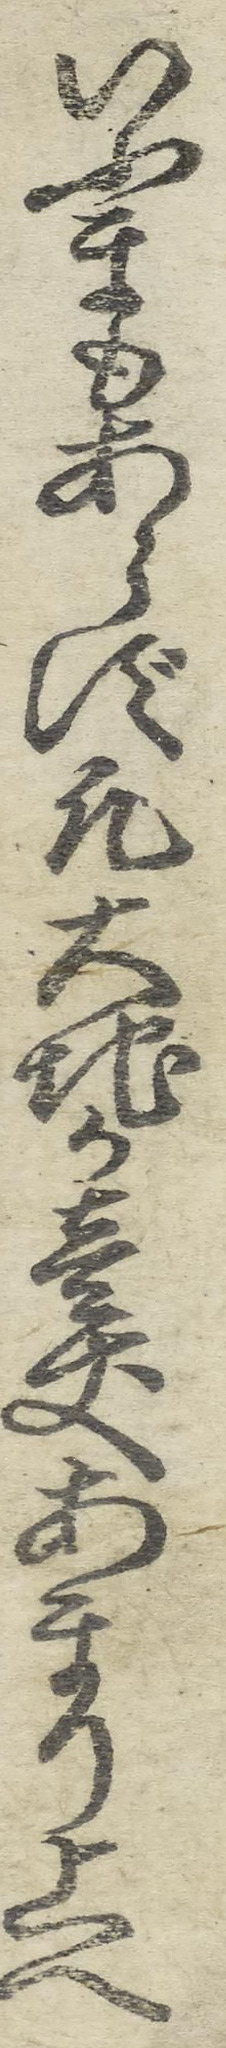いふまもあらず凡大地か壱丈あまり上へ
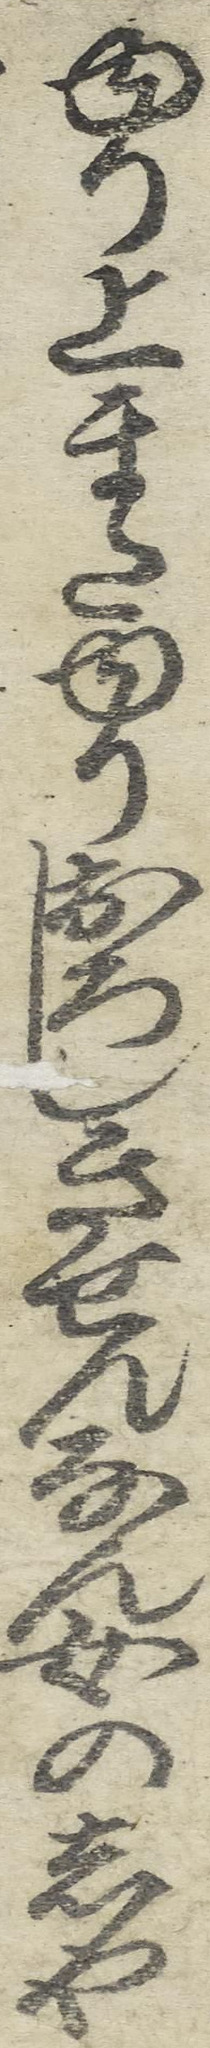ゆり上またゆりおろしきせんなん女のしや
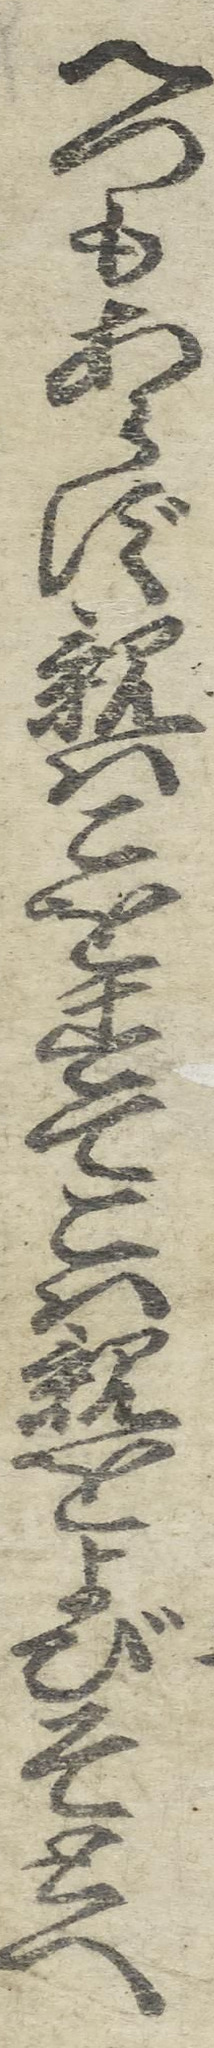へつもあらず親はこをすてこは親をよびそとへ
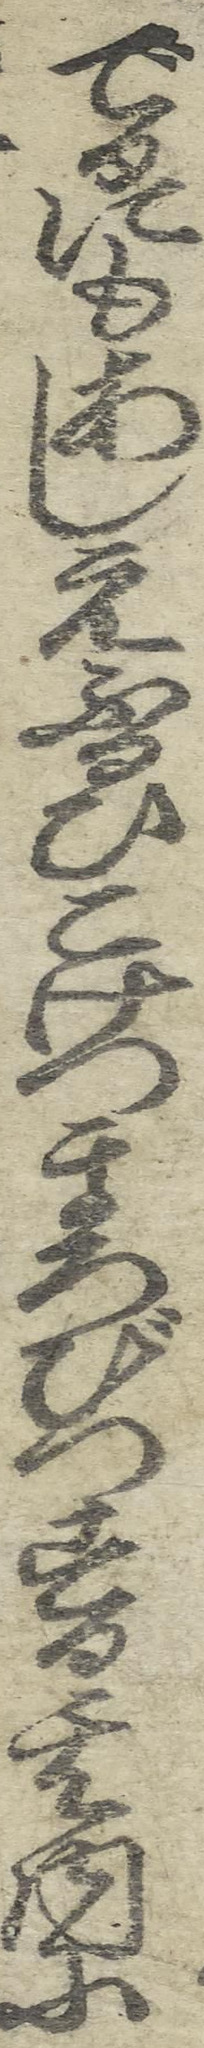でるにもあし元ふるひこけつまろびつする其内に
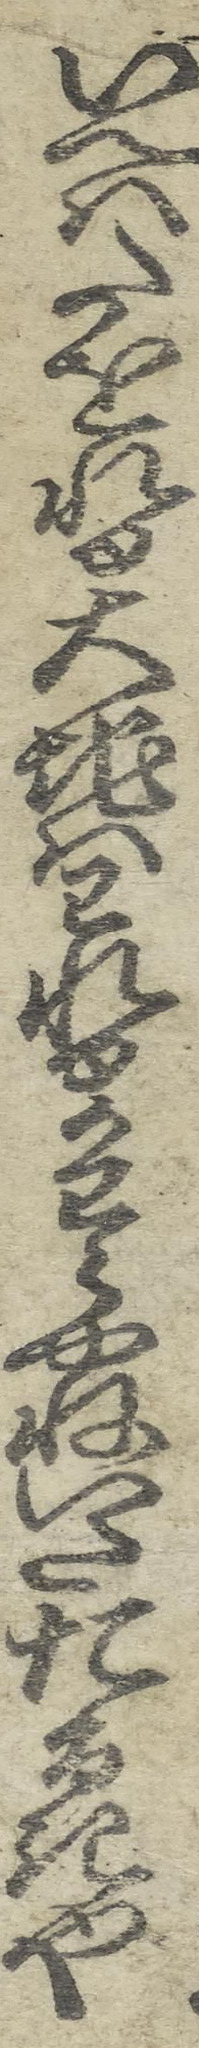いへはたをれる大地はわれるかわらやねいたたるきや
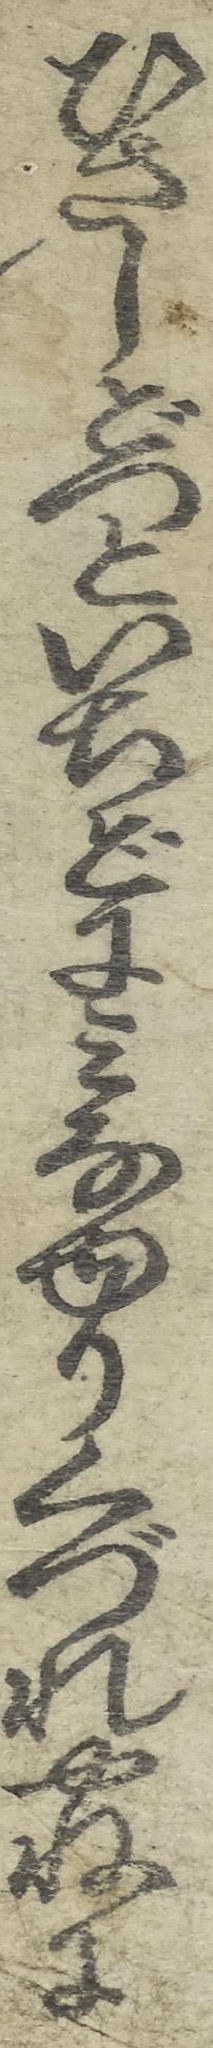ひさしどつといちどにみなゆりくづれやねに
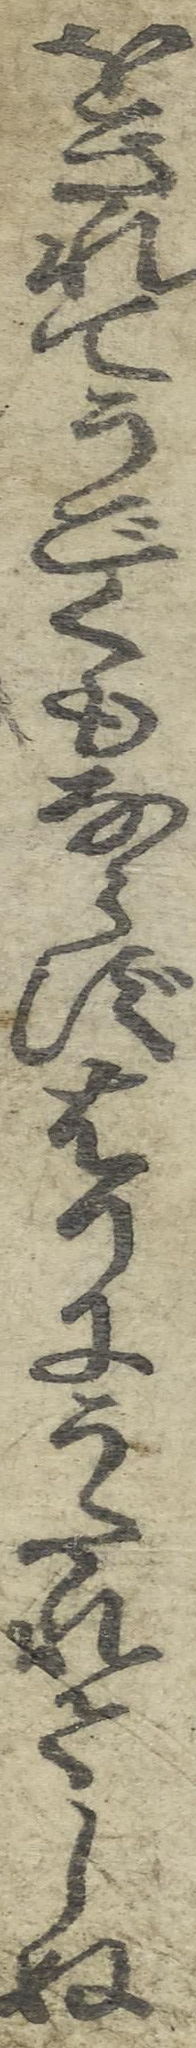をされてうごくもならずはりにうたれてしぬ
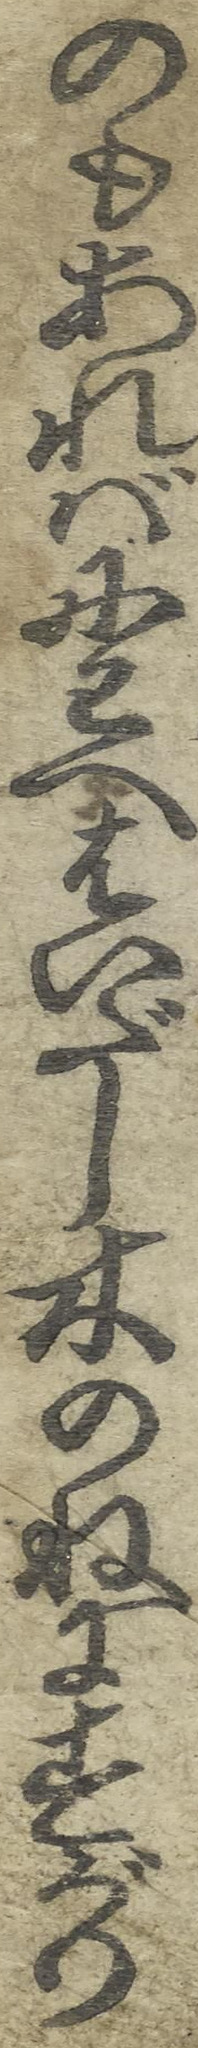のもあればにわへはいだし木のねにすがり

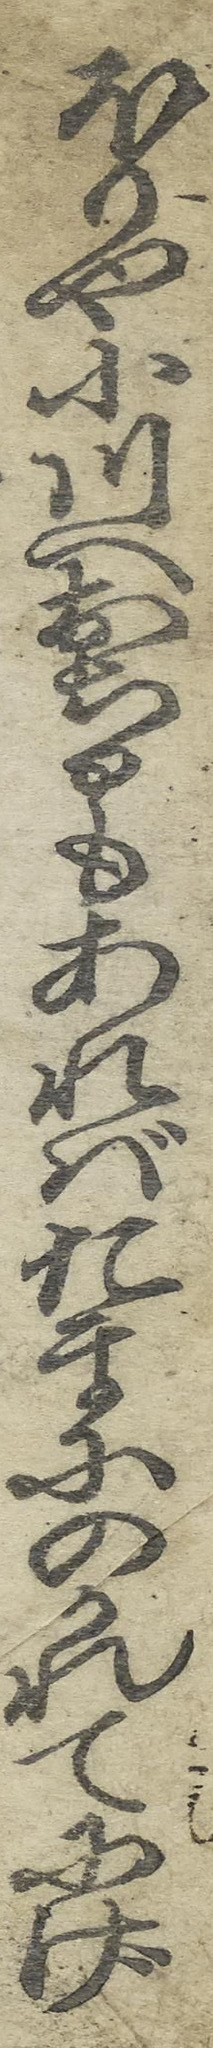ほりや小川へおちるもあればたまにのかれてにげ
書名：地震くどき　上・下
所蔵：東京大学地震研究所図書室 Earthquake Research Institute Library, The University of Tokyo, JAPAN
